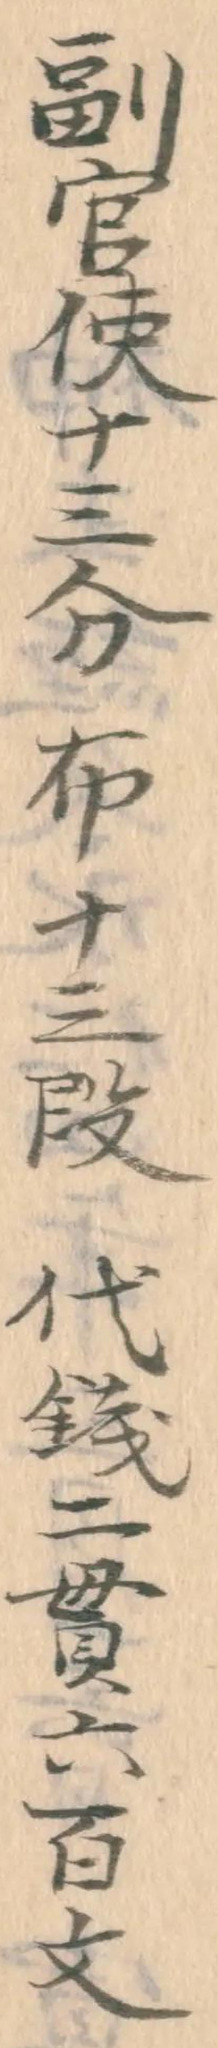副官使十三分布十三段代銭二貫六百文
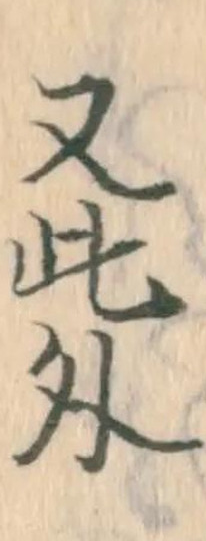又此外
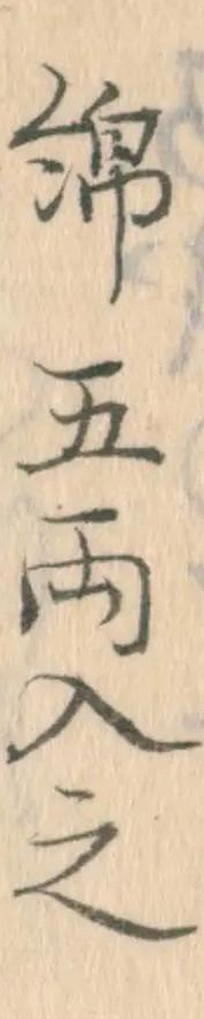綿五両入之
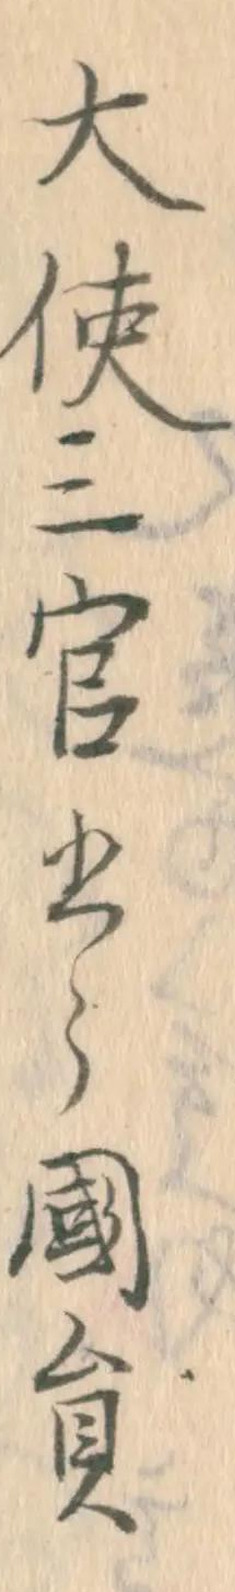大使三官書々国員
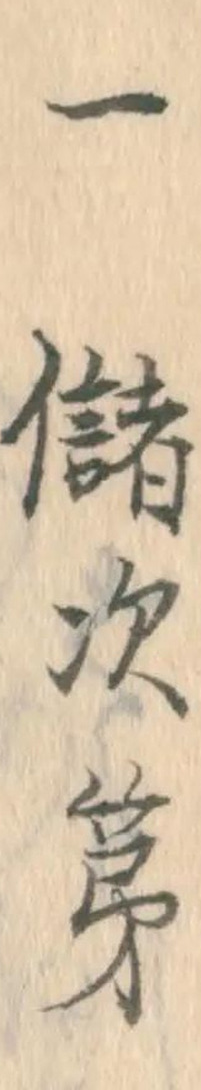一儲次第
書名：賀茂社記録. 第19冊
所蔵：国立国会図書館 National Diet Library, JAPAN
